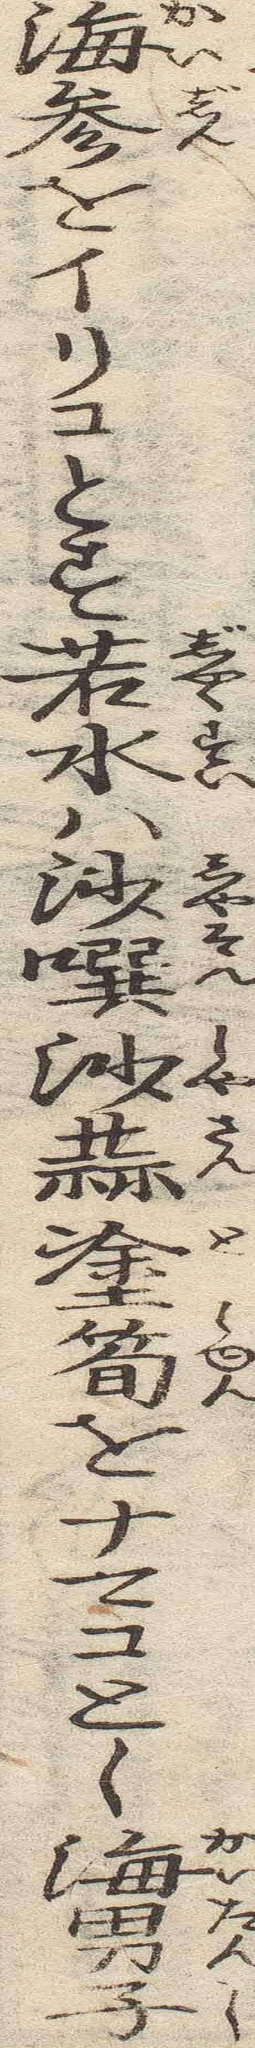海参をイリコとす若水は沙噀沙蒜塗筍をナマコとし海男子
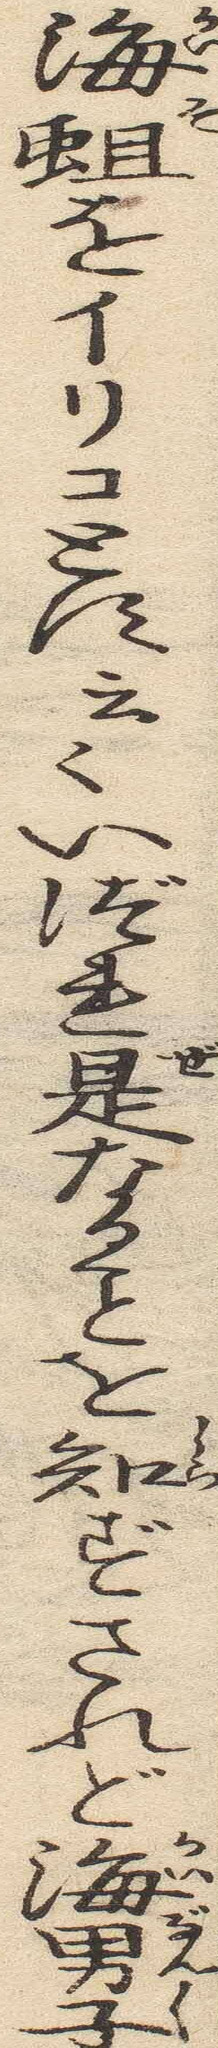海蛆をイリコとす云々いづれ是なることを知ずされど海男子
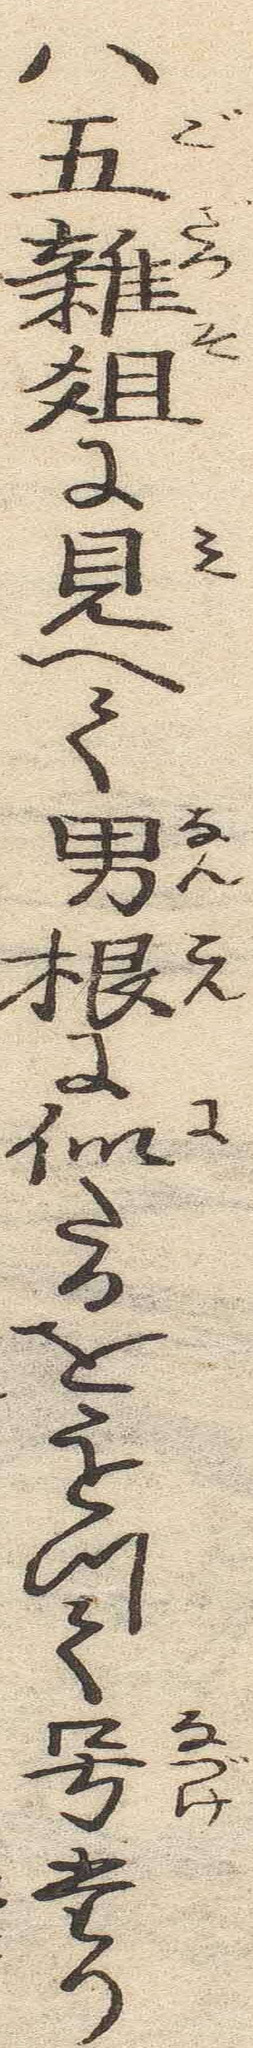は五雑俎に見へて男根に似たるをもつて号たり
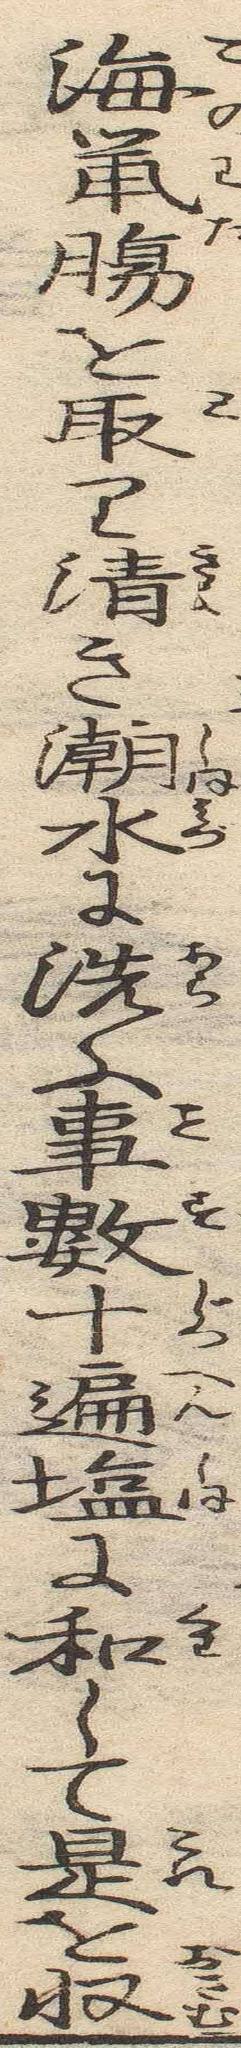海鼠腸を取り清き潮水に洗ふ事数十遍塩に和して是を収
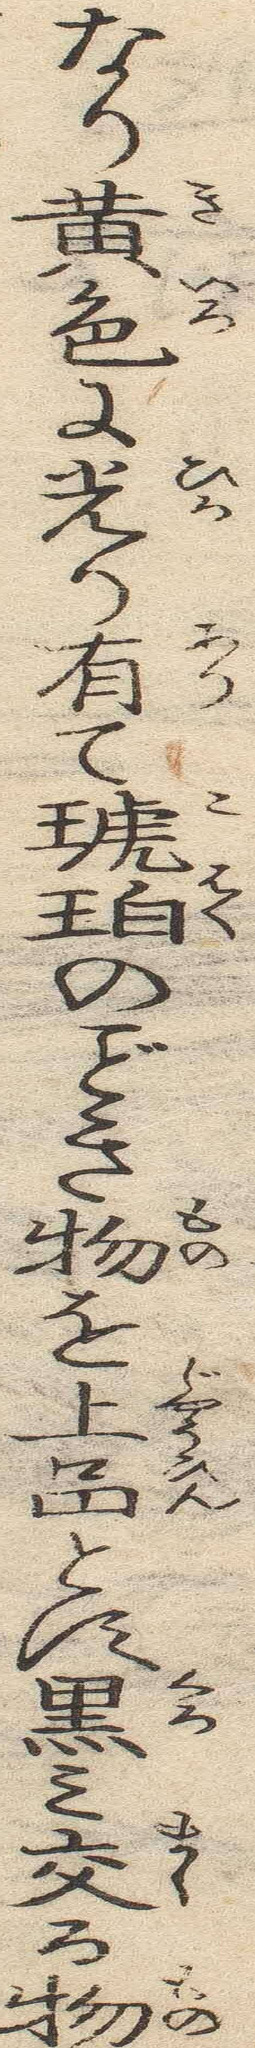なり黄色に光り有て琥珀のごとき物を上品とす黒み交る物
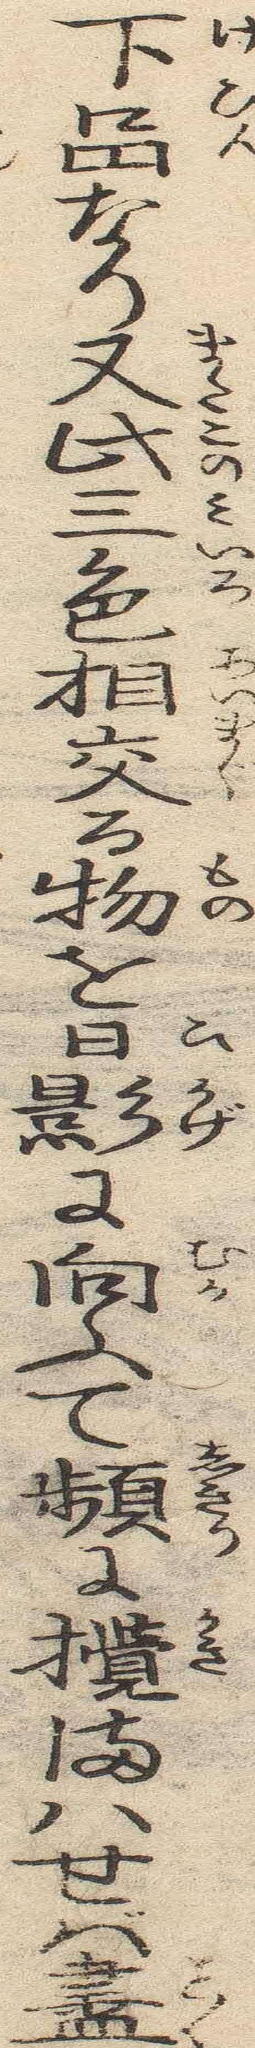下品なり又此三色相交る物を日影に向ふて頻に撹まはせば尽
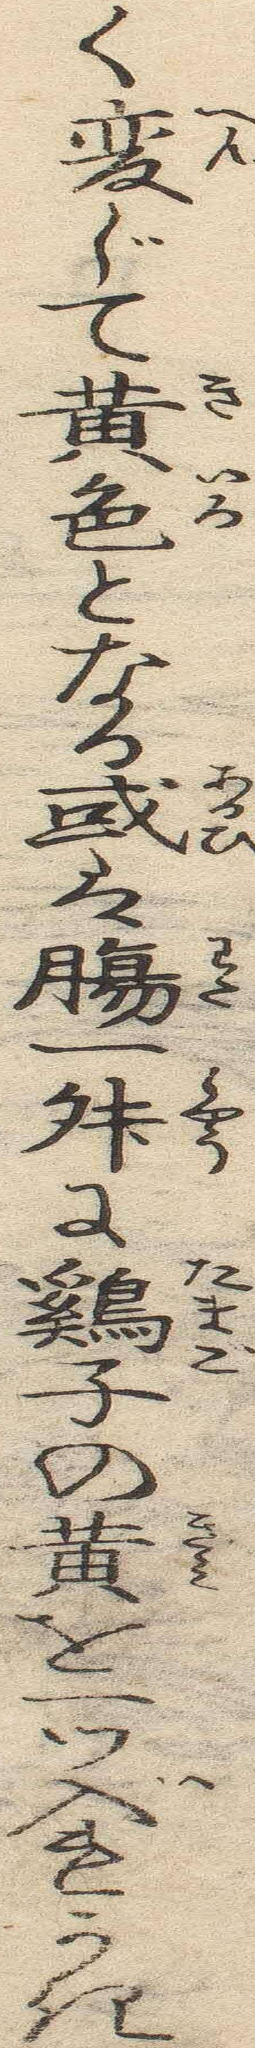く変黄色となる或は腸一舛に鶏子の黄を一ツ入れかき
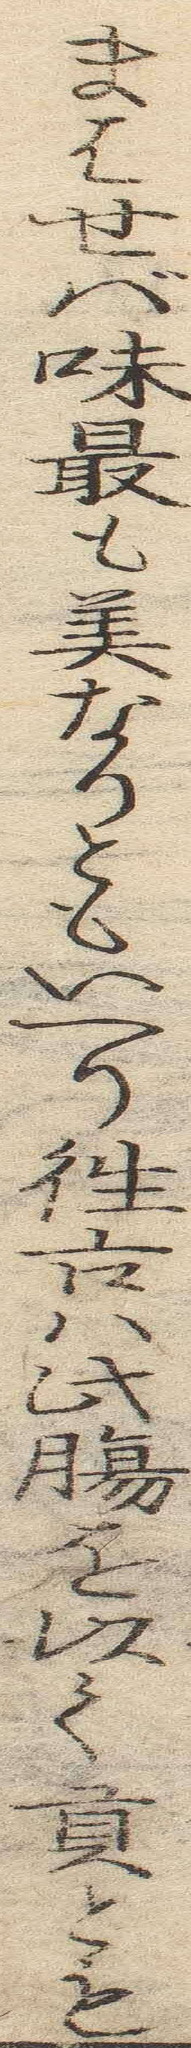まはせば味最も美なりともいへり往古は此腸を以て貢とも
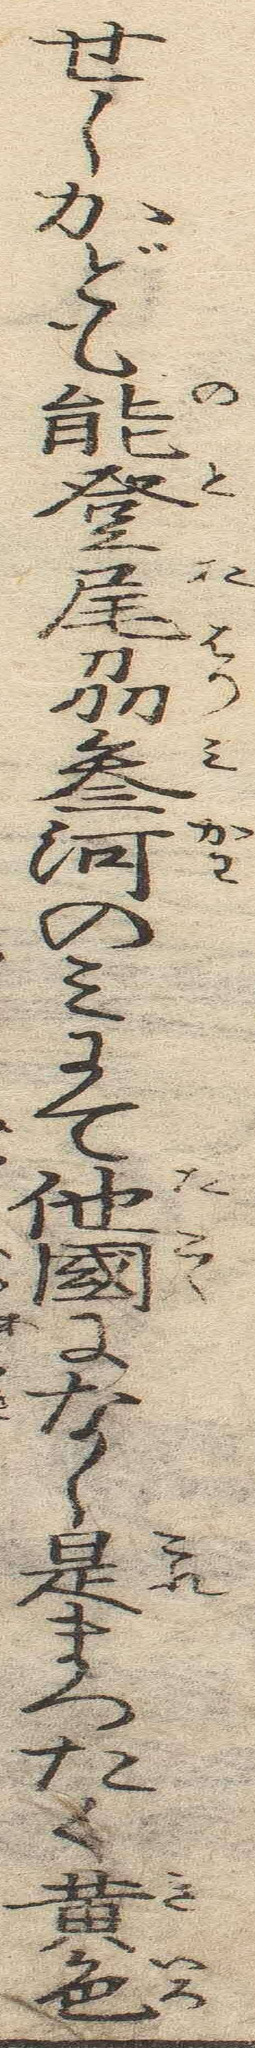せしかども能登尾州参河のみにて他国になし是まつたく黄色
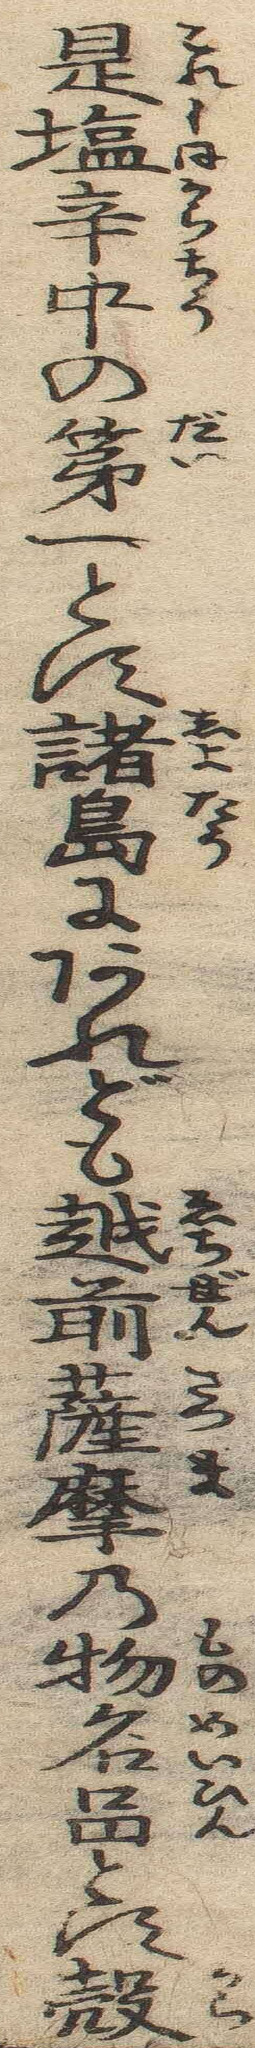是塩辛中の第一とす諸島にあれども越前薩摩の物名品とす殻

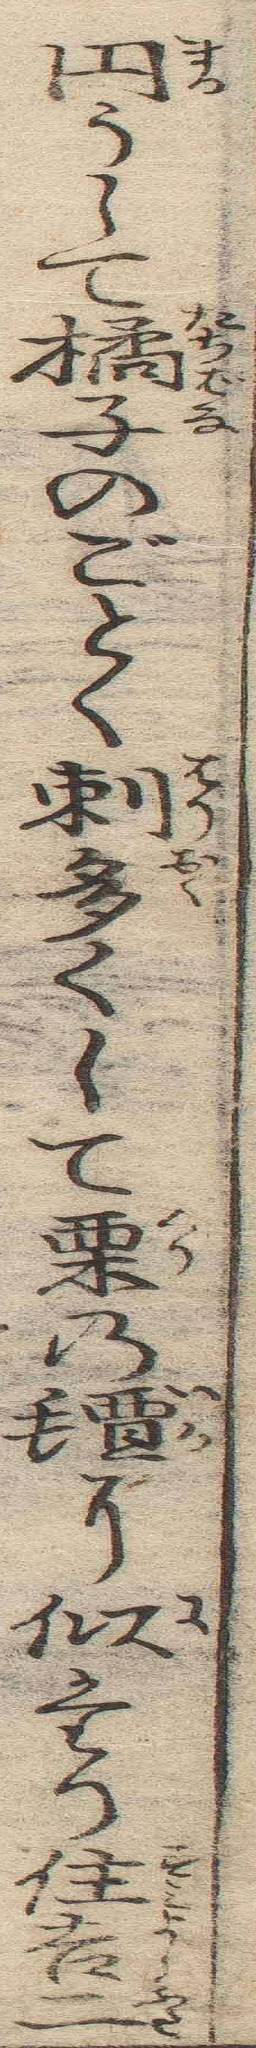円うして橘子のごとく刺多くして栗の氈に似たり住吉二
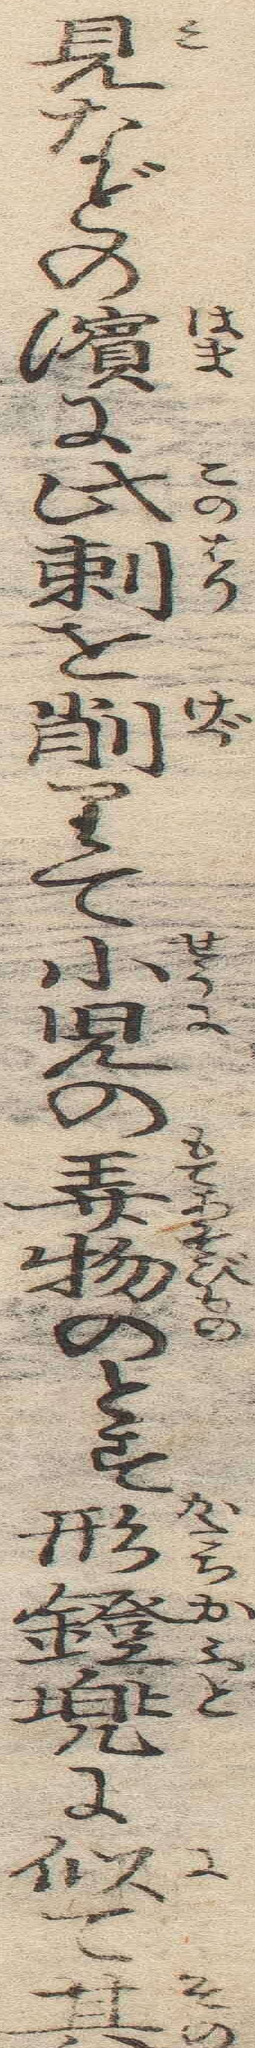見などの浜に此刺を削りて小児の弄物のとす形鎧兜に似て其
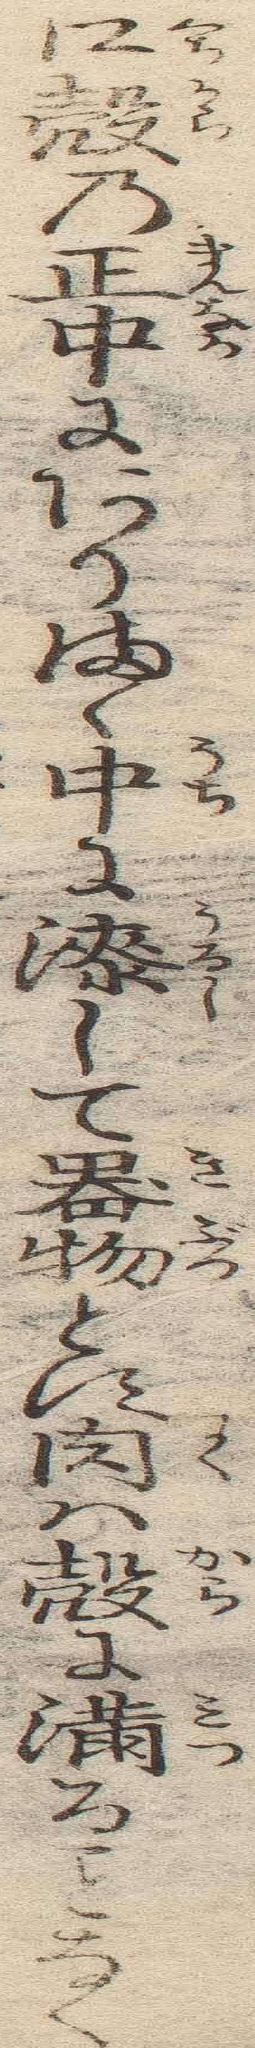口殻の正中にありまゝ中漆して器物とす肉は殻を満ることなく
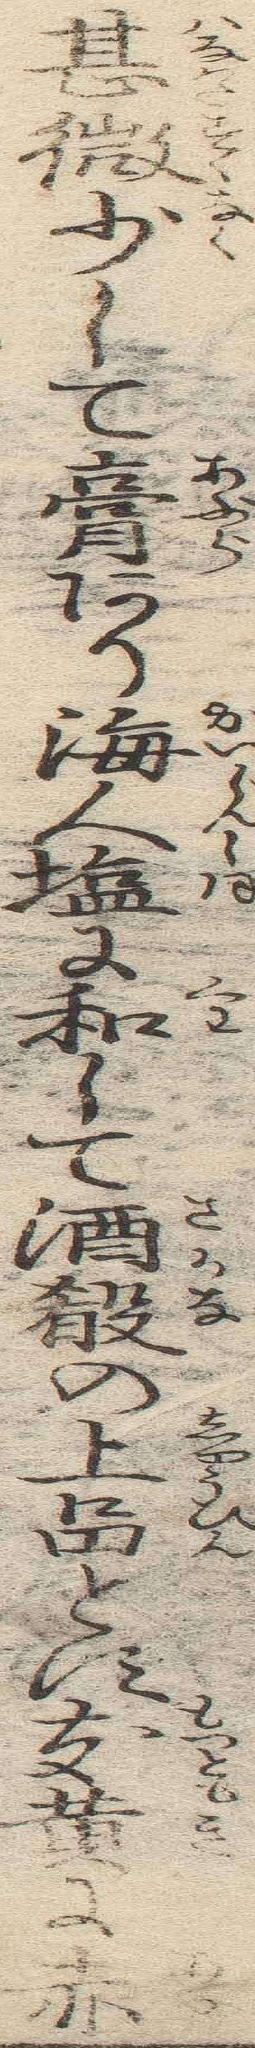甚微少して膏あり海人塩に和して酒殽の上品とす尤黄に赤
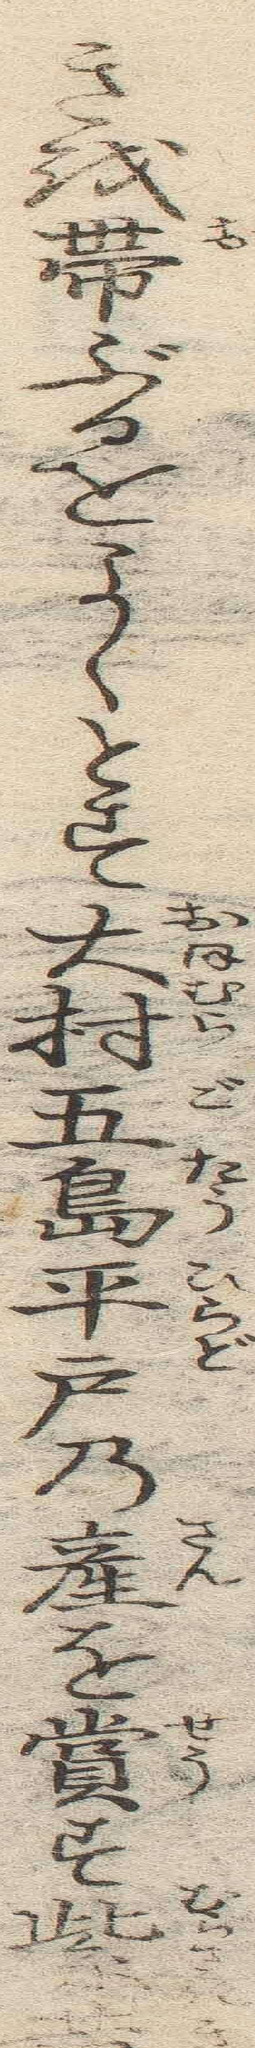きを帯ぶるをよしとす大村五島平戸の産を賞す紫黄な
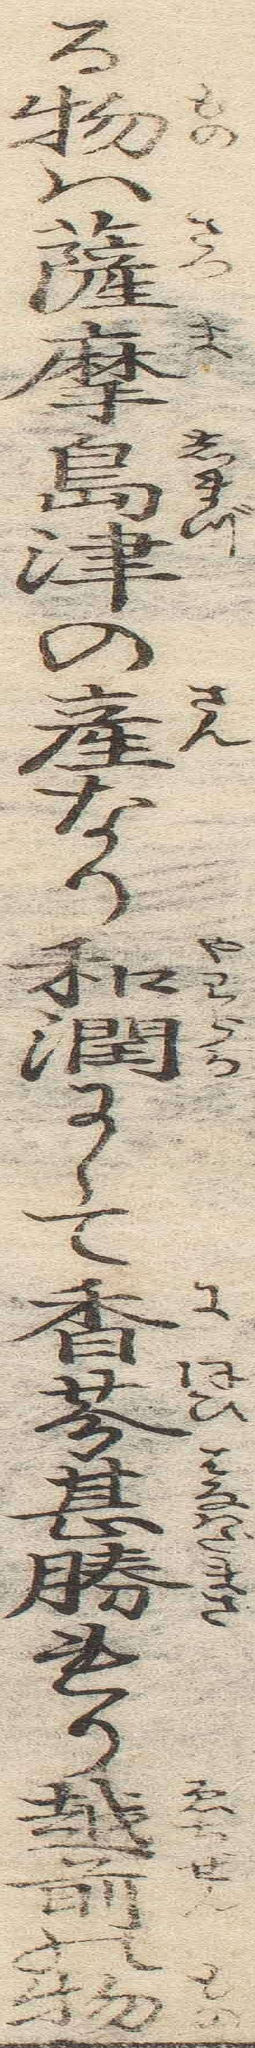る物は薩摩島津の産なり和潤にして香芬甚勝れり越前の物
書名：日本山海名産図会
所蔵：東京学芸大学附属図書館 国文学研究資料館
